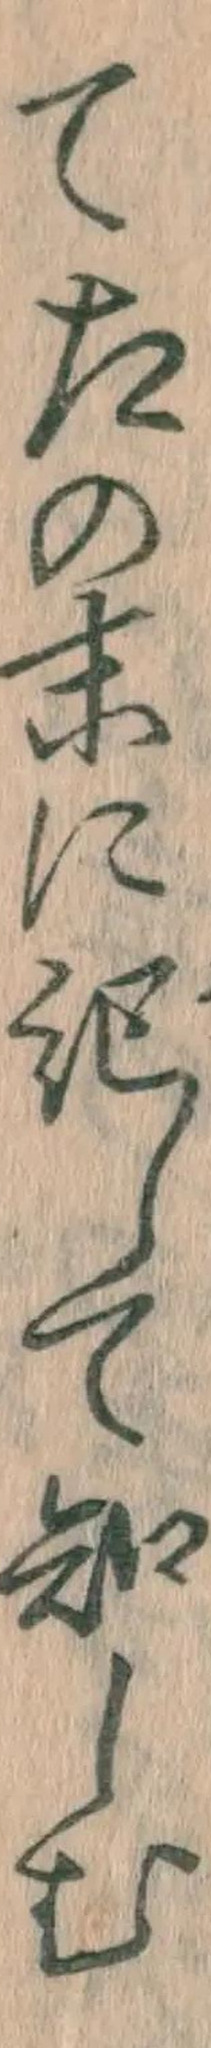て左の末に記して知しむ
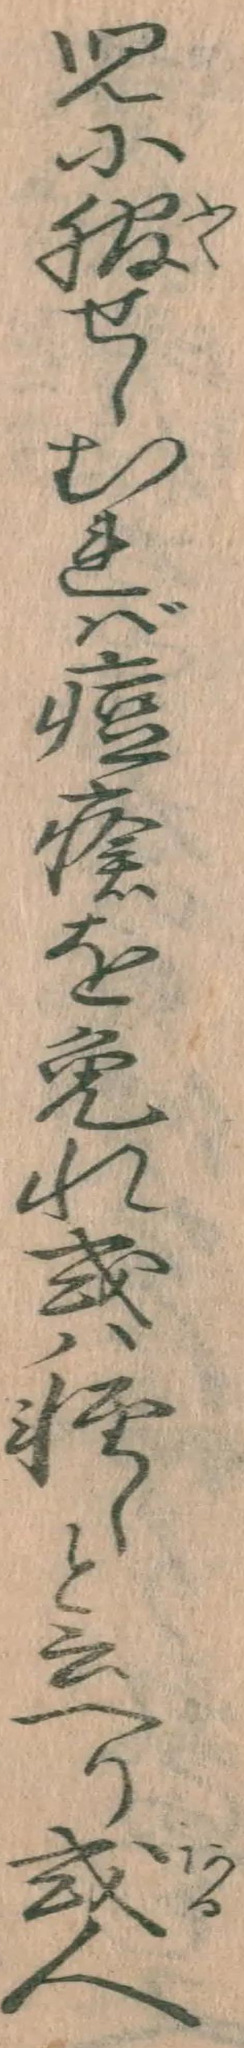児に服せしむれば痘瘡を免れ或は軽しと云へり或人
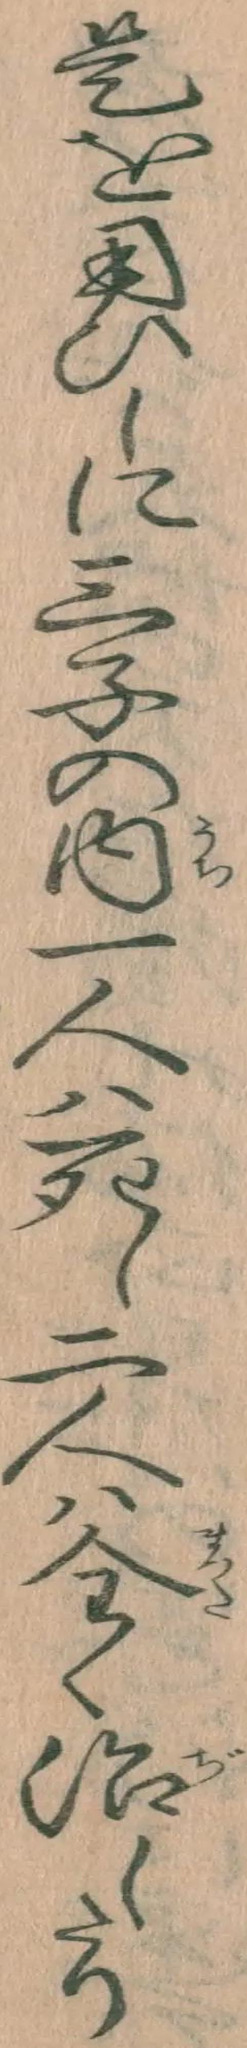是を用ひしに三子の内一人は死し二人は全く治したり
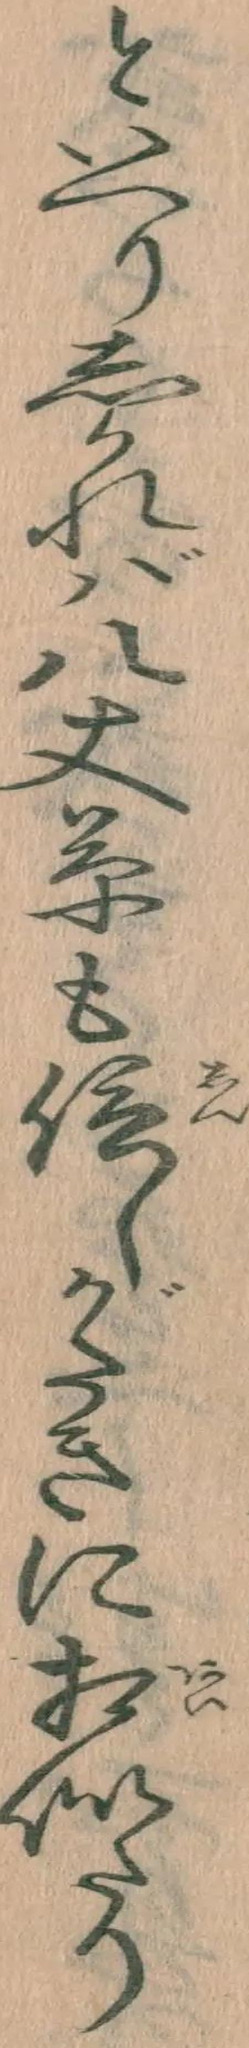といへりしかれば八丈草も信しがたきに相似たり

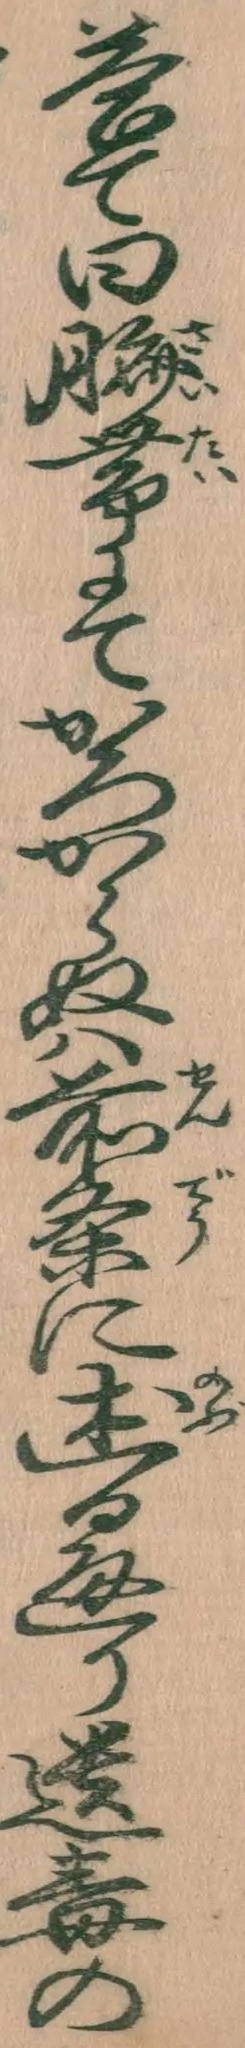答て曰臍帯にてかろからぬは前条に述る通り遺毒の
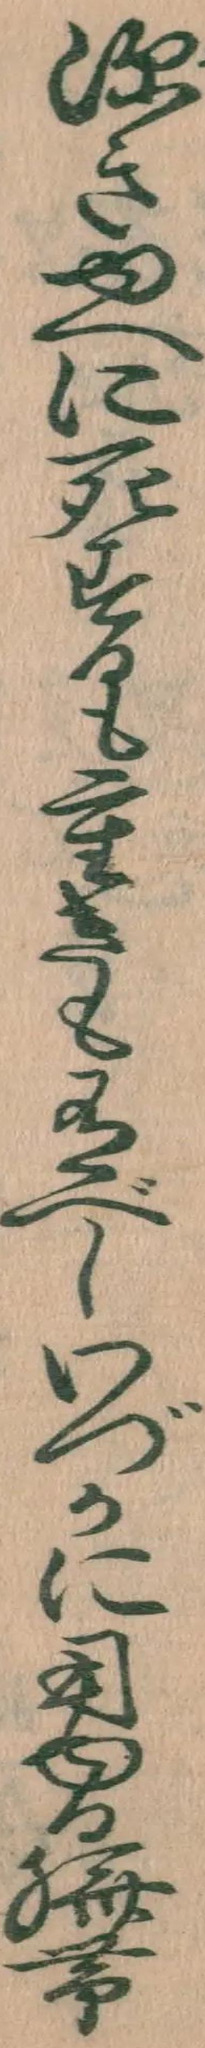深きゆへに死するも重きも有べしわづかに用ゆる臍帯
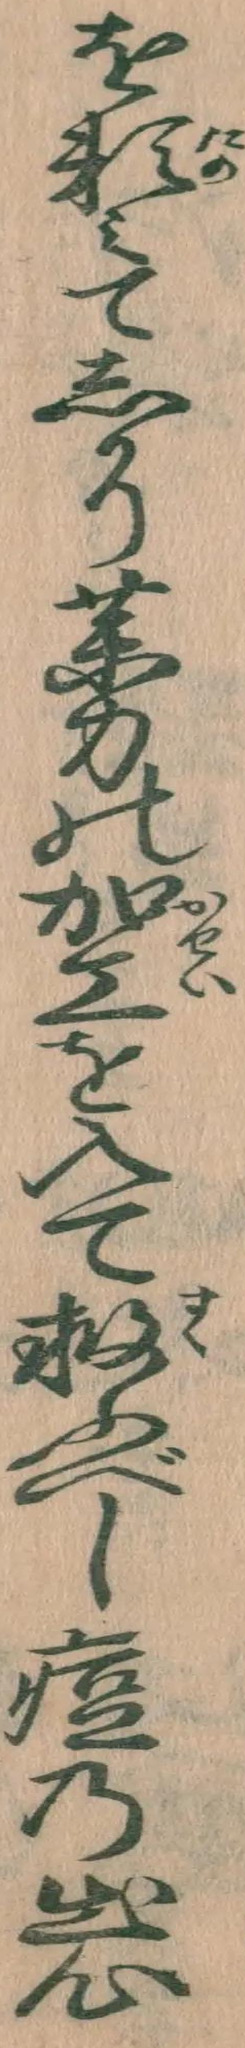を頼みてしかり菜力の加工を入て救ふべし痘の出心
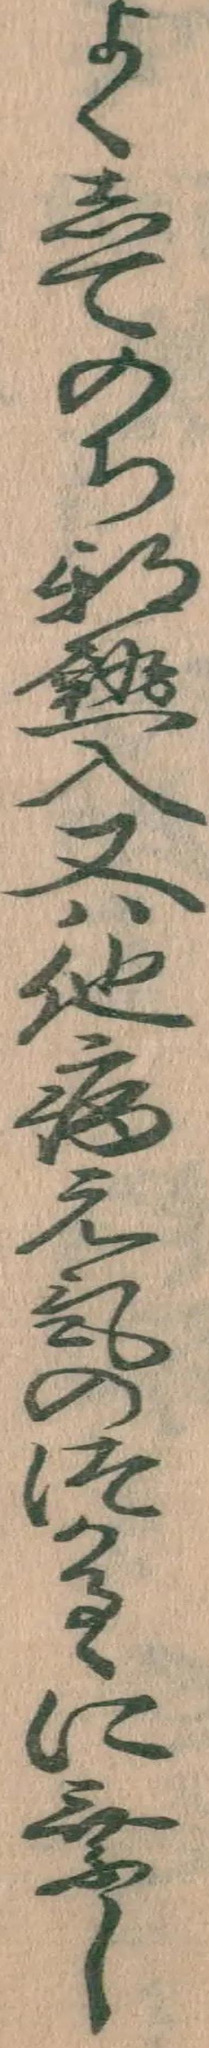よくしてのち邪熱入又は他病元気のつかるゝに乗し
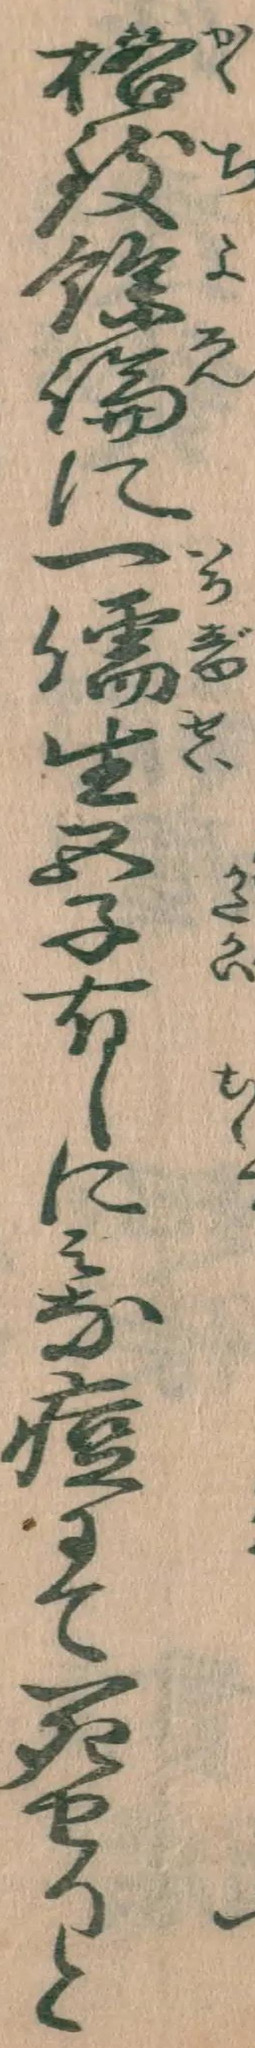格致余論に一儒生五子有しにみな痘にて死せりと
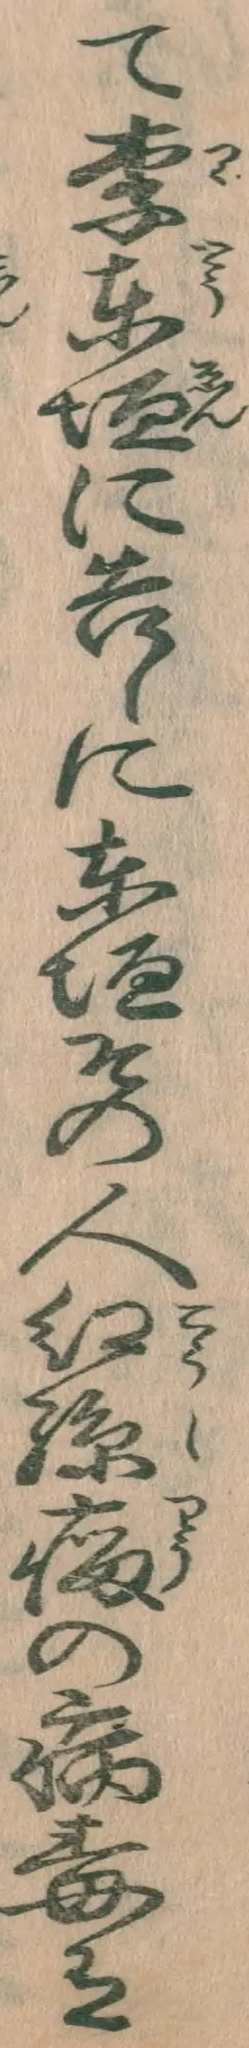て李東垣に告しに東垣その人紅孫瘤病毒有
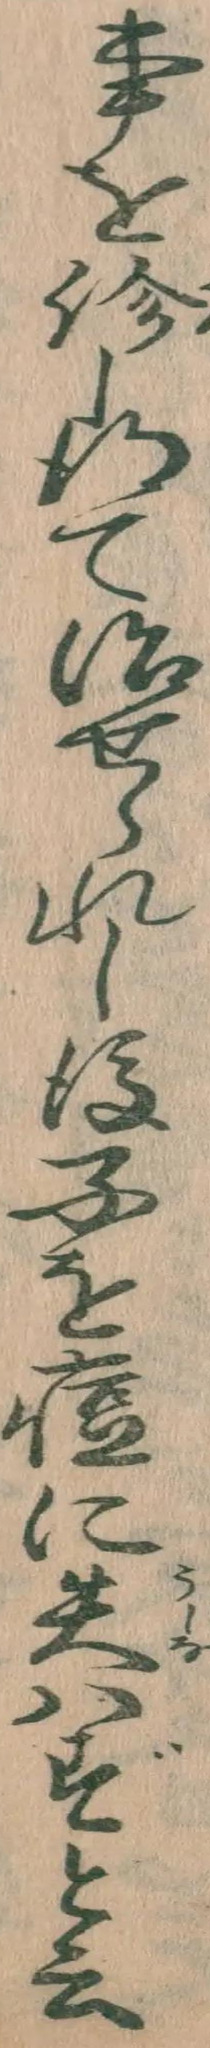事を診し得て治せられし後子を痘に失はずと云
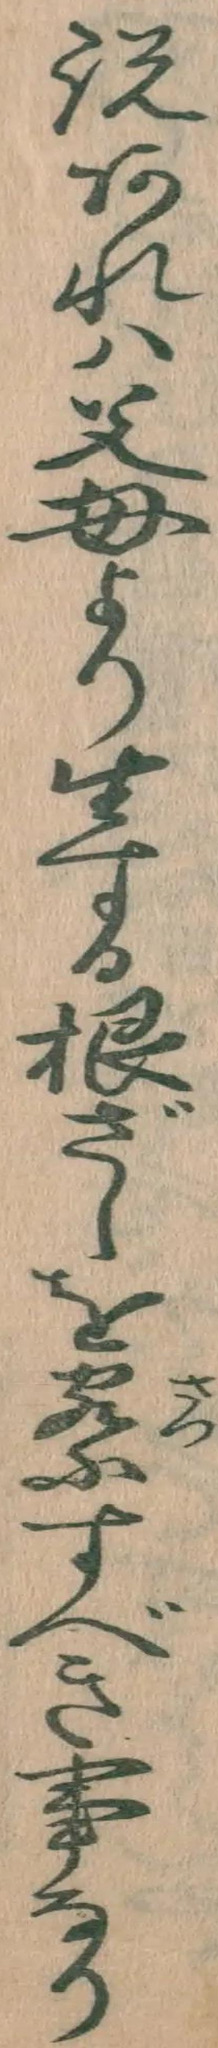説あれは父母より生する根ざしを察すべき事なり

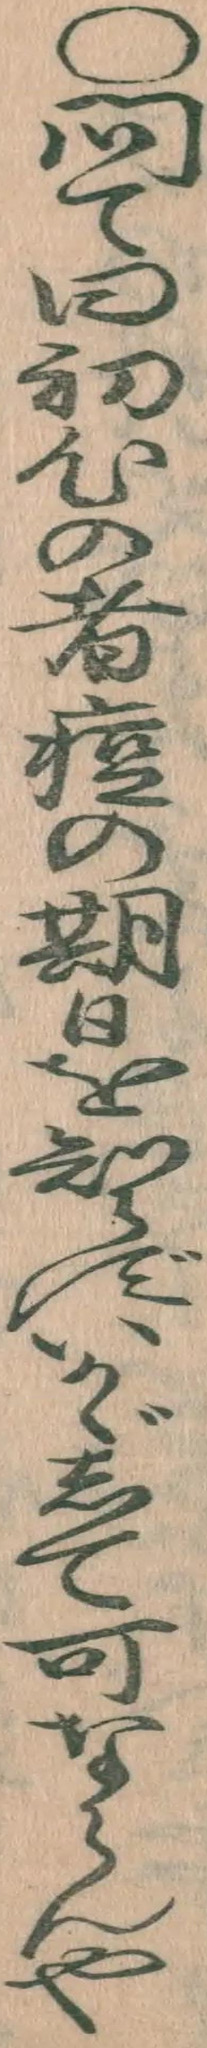○問て曰初心の者痘の期日を知らずいかゞして可ならんや
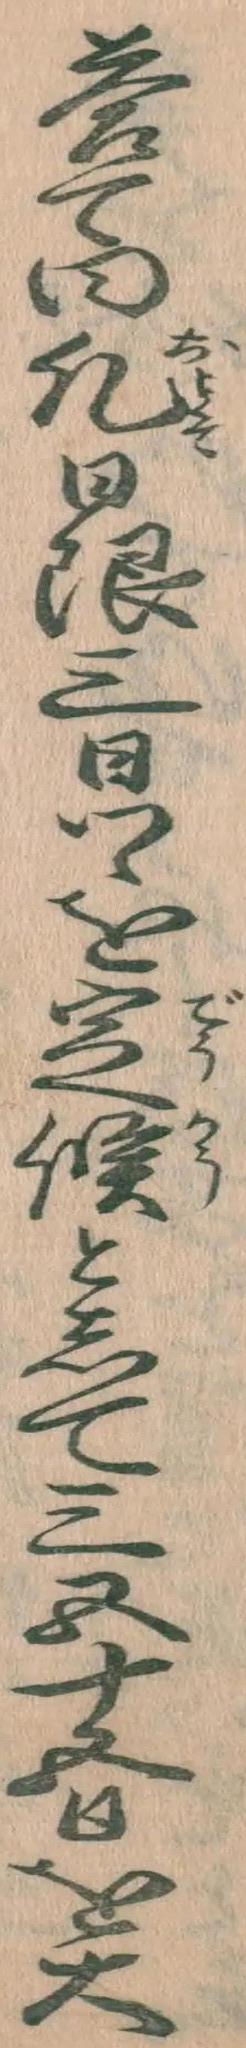答て曰凡日限三日つゝを定候として三五十五日を大
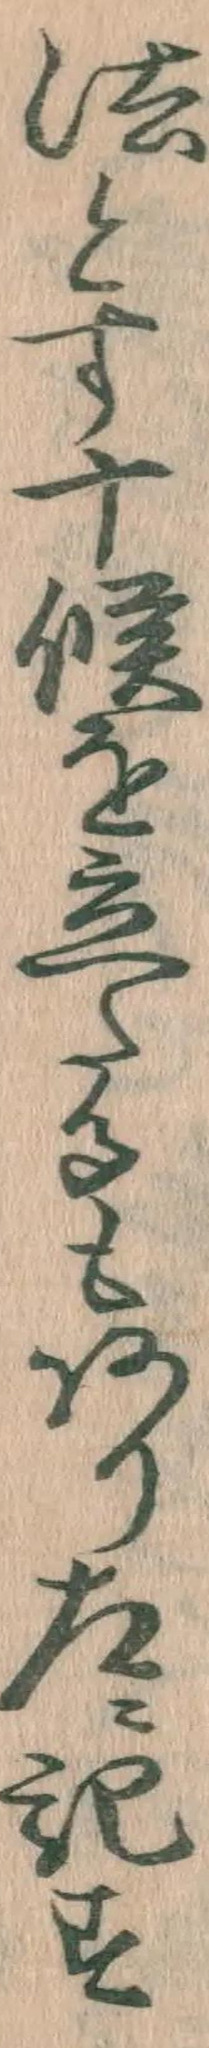法とす十候を立たるもあり左に記す
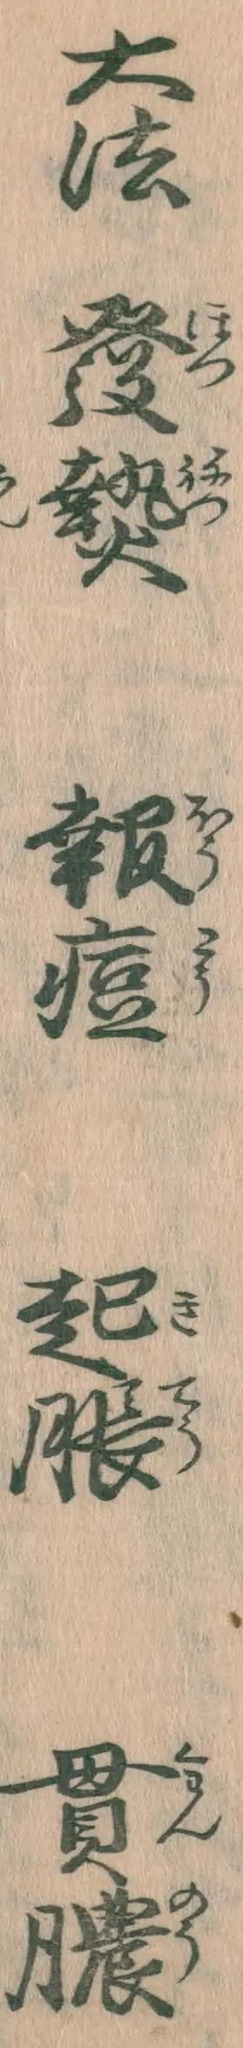大法発熱報痘起脹貫膿
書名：痘家初心問答
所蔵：国立国会図書館 National Diet Library, JAPAN
